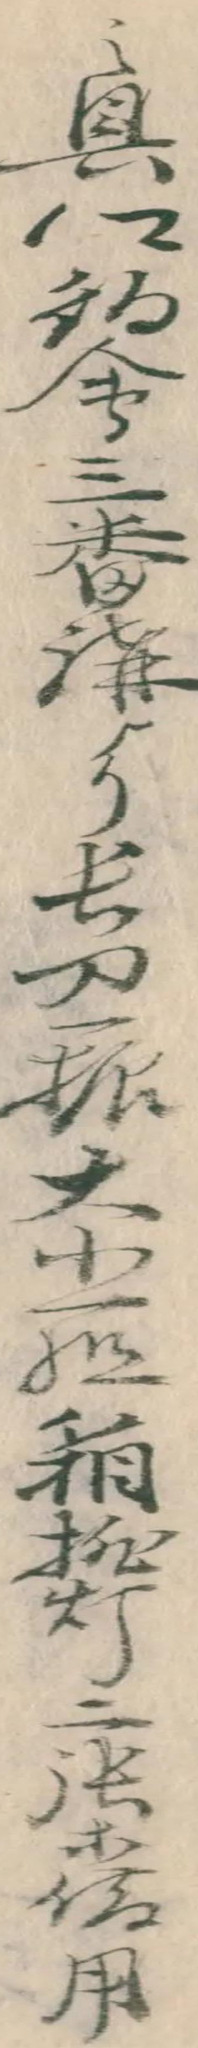之具郷約會三番講より長刀一振大小一組箱挑灯二張等借用
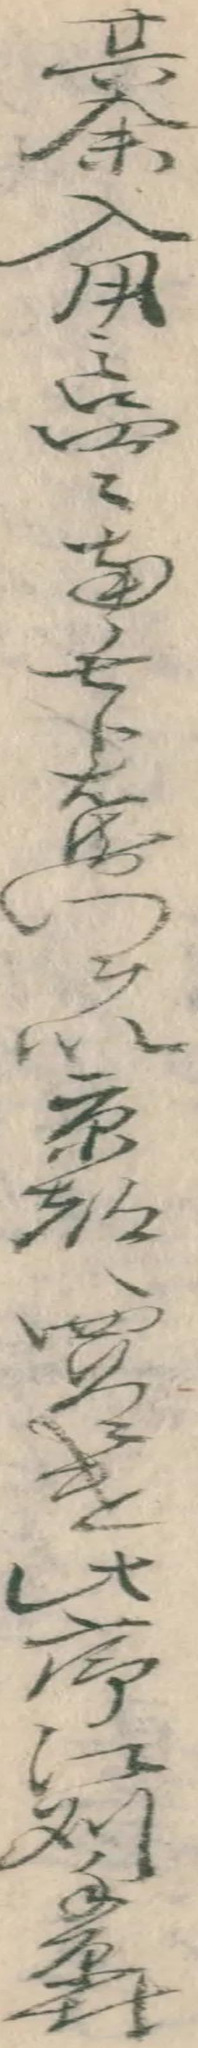其余入用之品々両七分右衛門ヲ以京都へ買ニ遣此序江州手原村
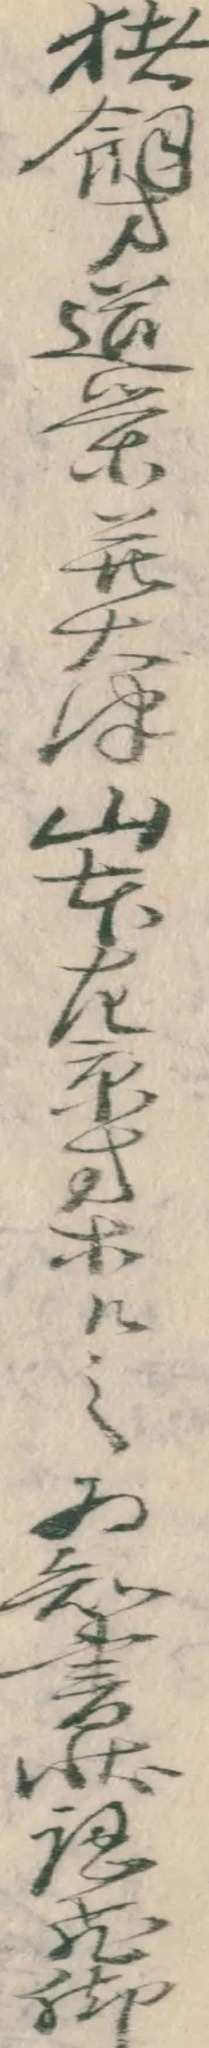猪飼方道栄幷大津山本左京方等え之為知書状認飛脚
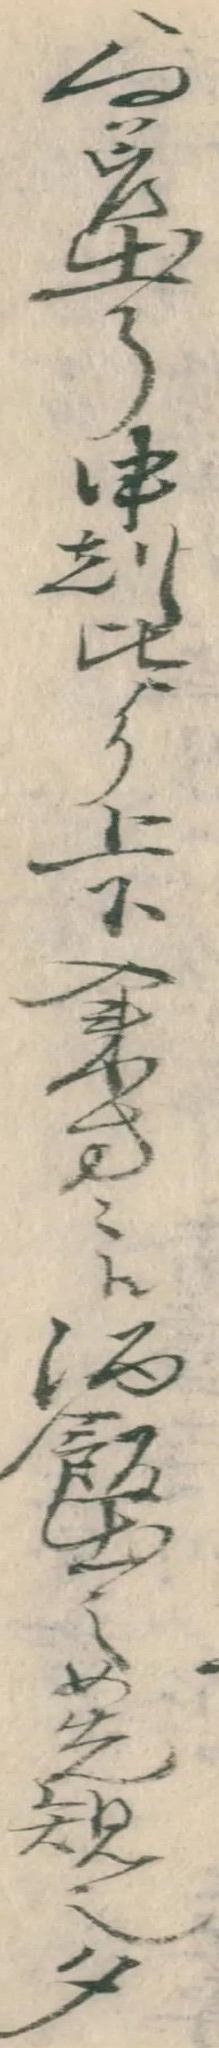へ向差出了申刻比より上下入来方々え酒飯出之如先規也夕
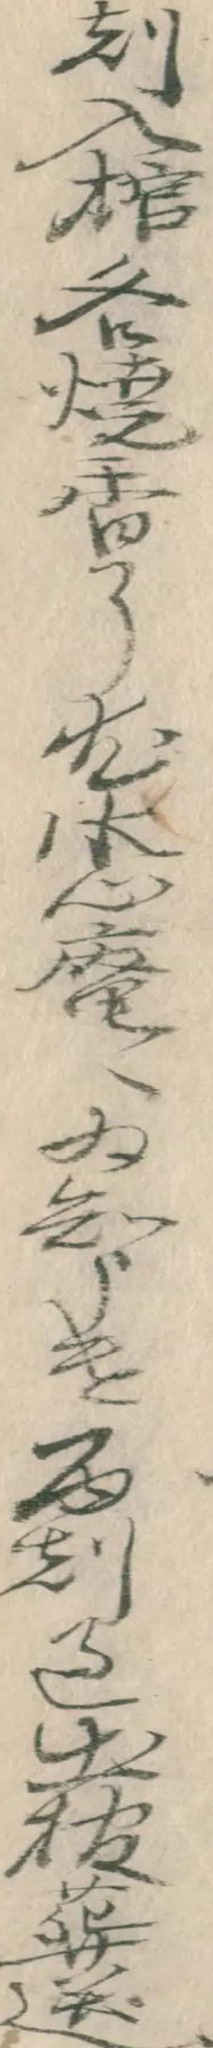刻入棺各焼香了尤水心庵へ為知申遣酉刻過出棺葬送
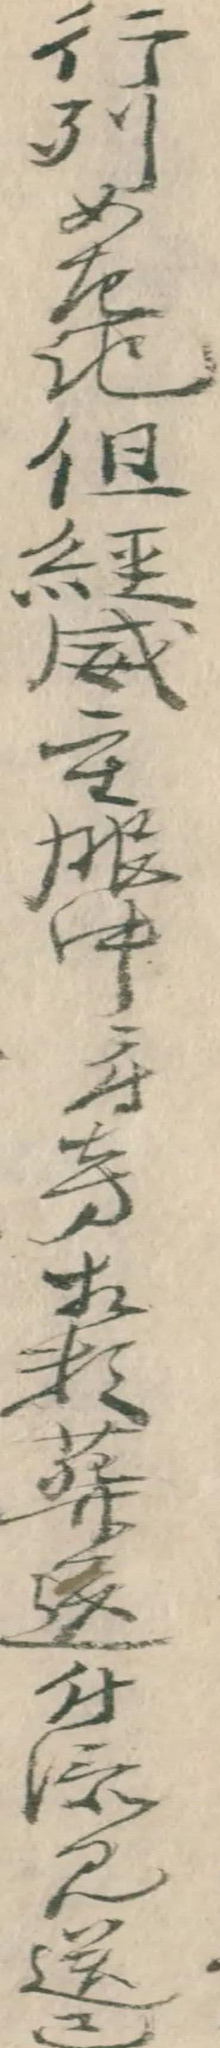行列如左記但経威重服中ニ付旁相頼葬送付添見送已
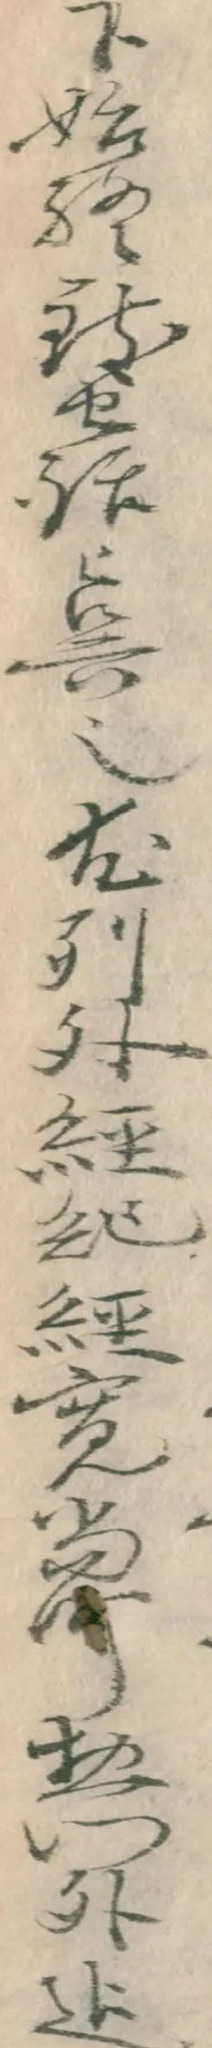下始終致世話被呉也尤列外経紀経寛當町惣門外迄

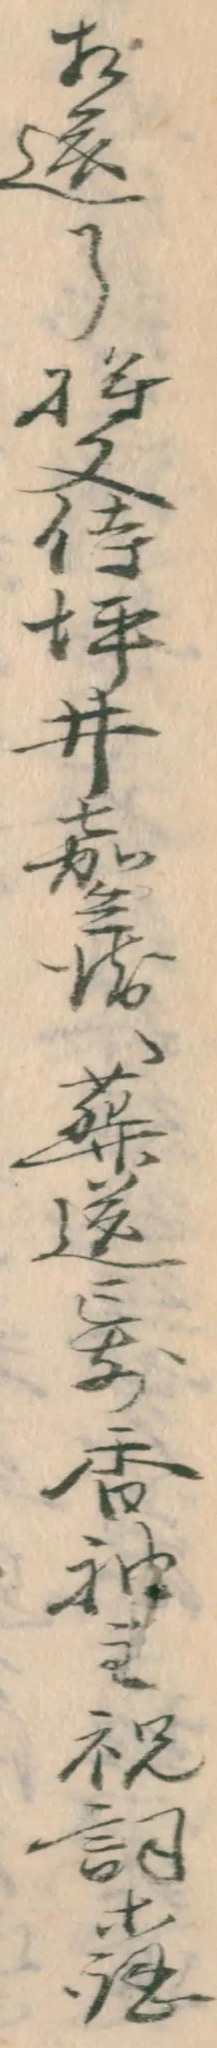相送了将又侍坪井嘉兵衛へ葬送已前香神主祝詞等認
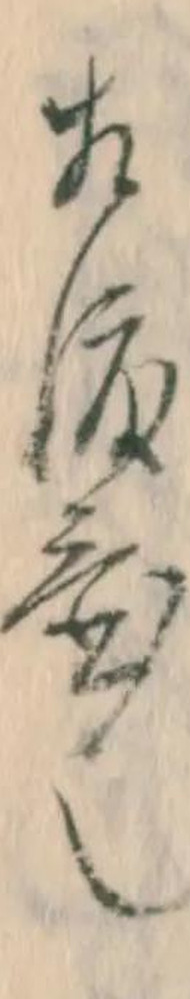相渡置之
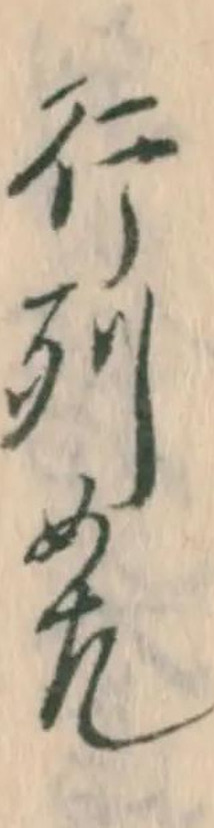行列如左
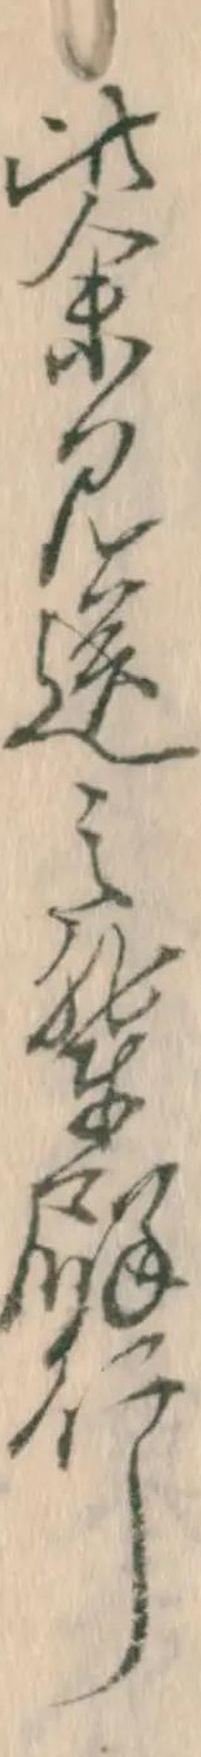此余見送之輩餘行
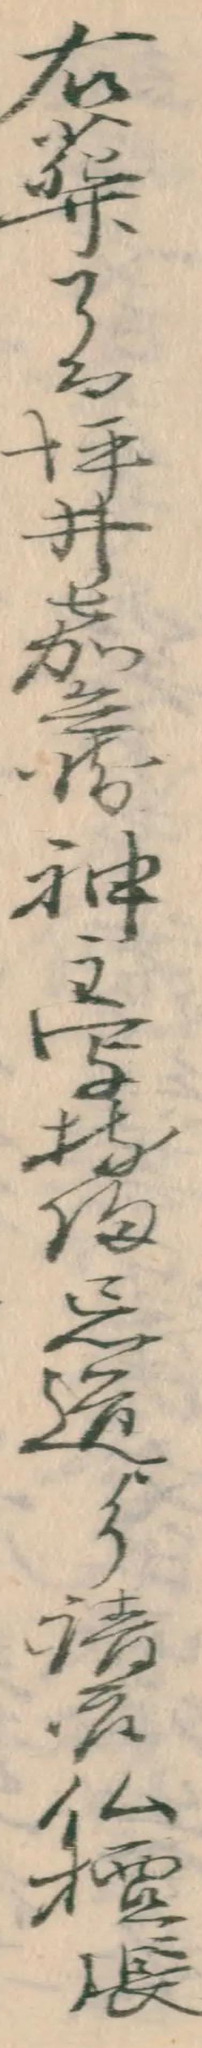右葬了而坪井嘉兵衛神主写持帰忌道より請取仏壇に帳
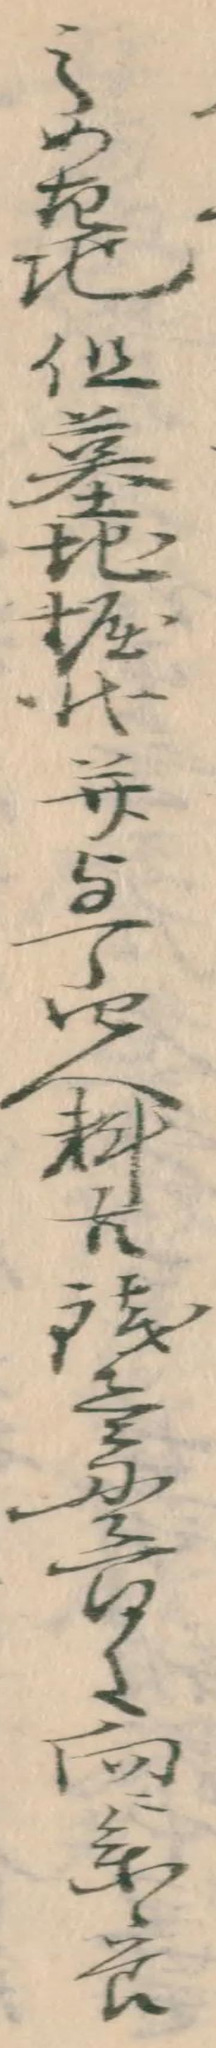之如左地但墓地堀代并与丁四人料共銭壱貫三百文向ニ参候節
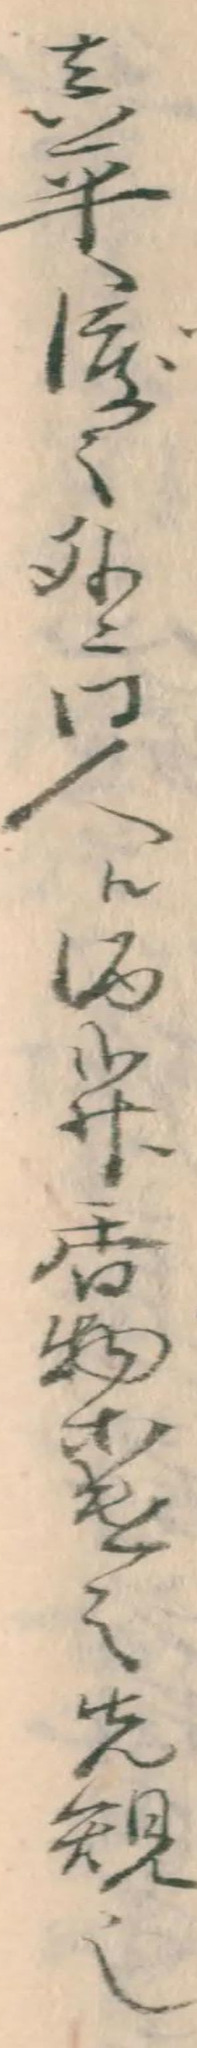真平へ渡之外に同人え酒弐升香物等遣之先規也
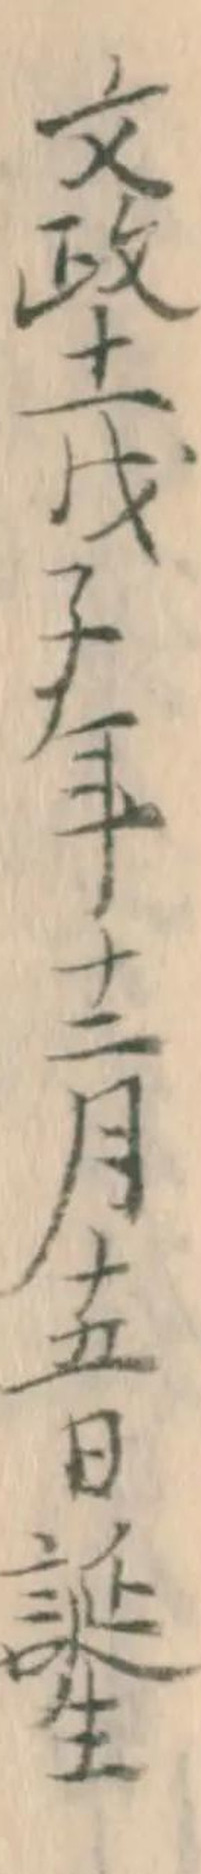文政十一戊子年十二月十五日誕生
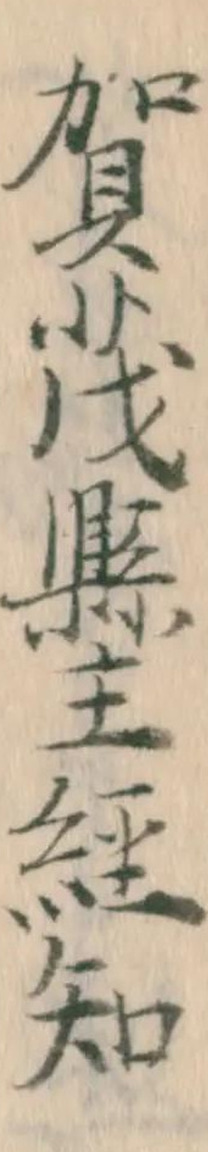賀茂県主経知
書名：賀茂社記録. 第66冊
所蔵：国立国会図書館 National Diet Library, JAPAN
